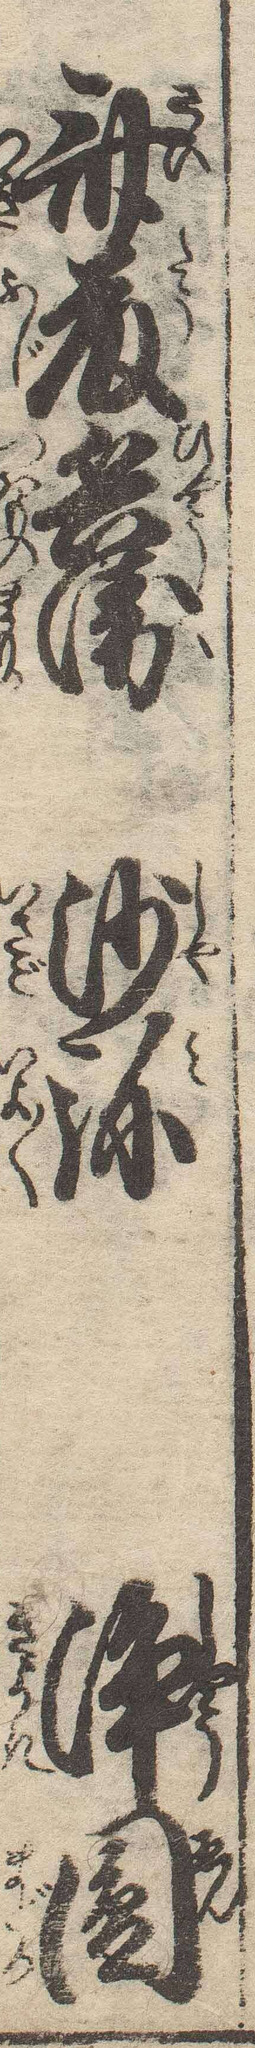斉藤兵衛沙弥浄圓
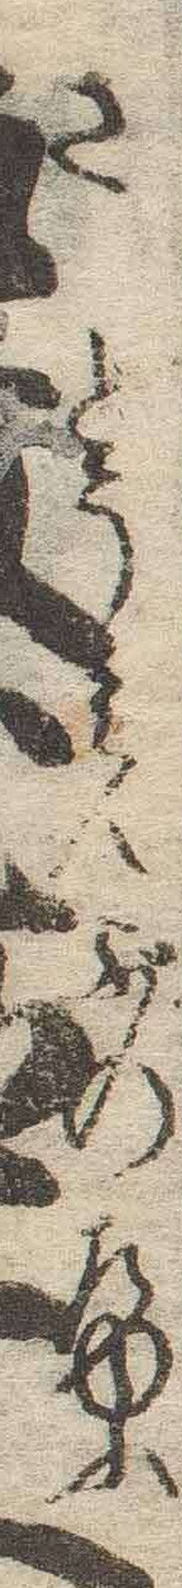さとうみんぶのたゆふ
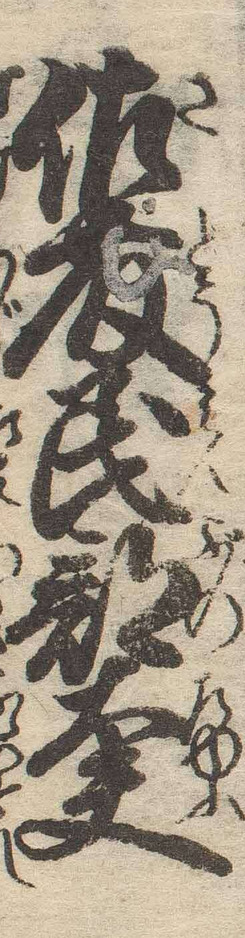佐藤民部太夫
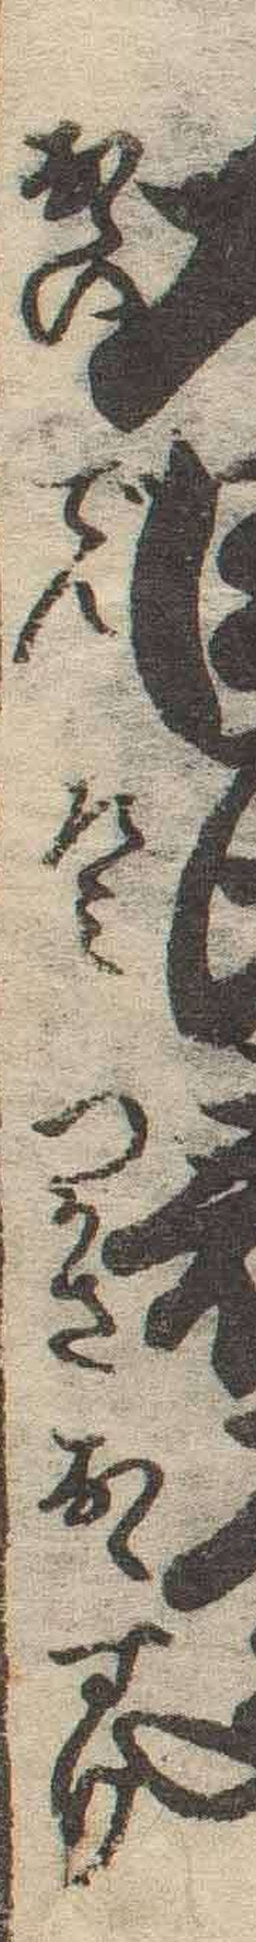おゝのでんたみつかさおゝすけ

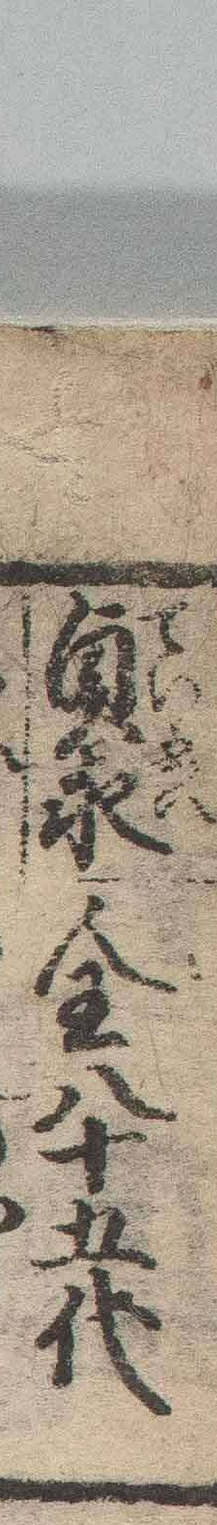貞永人王八十五代
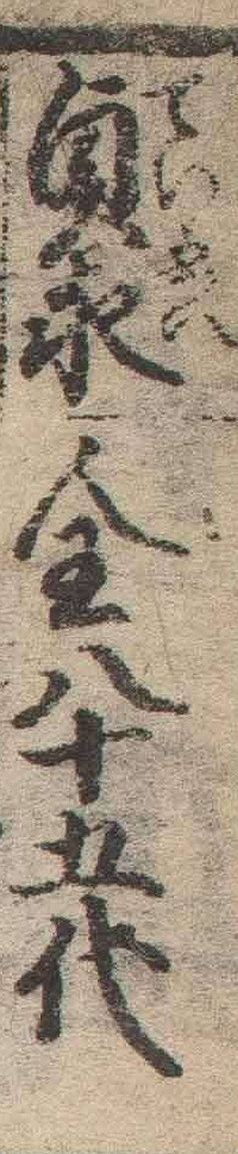貞永人王八十五代
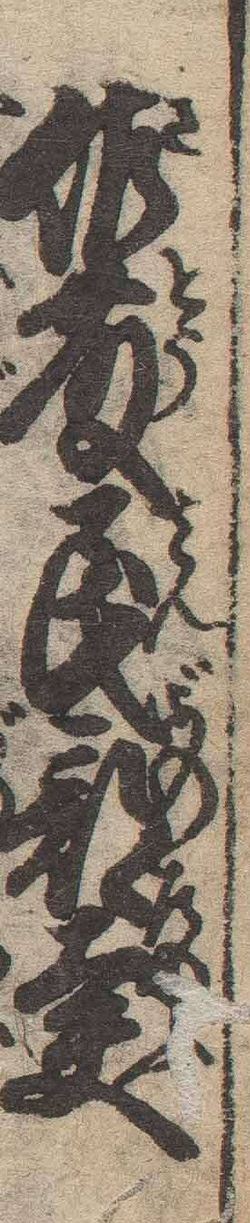佐藤民部太夫
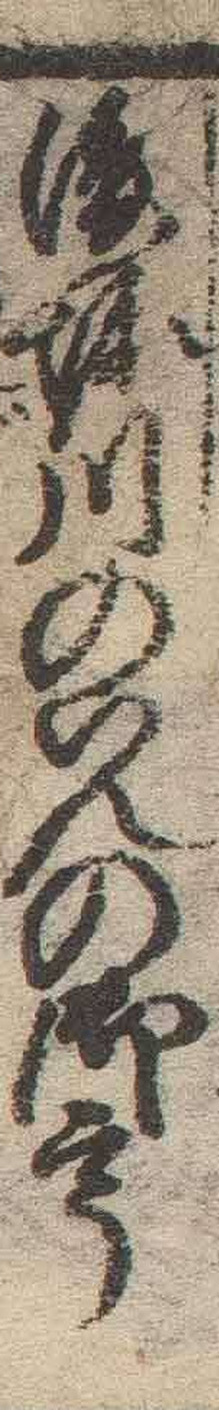後堀川のいんの御宇
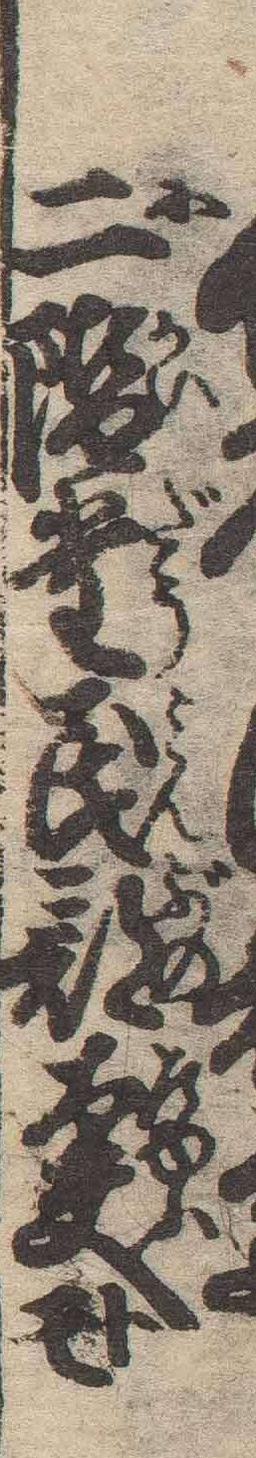二階堂民部太夫
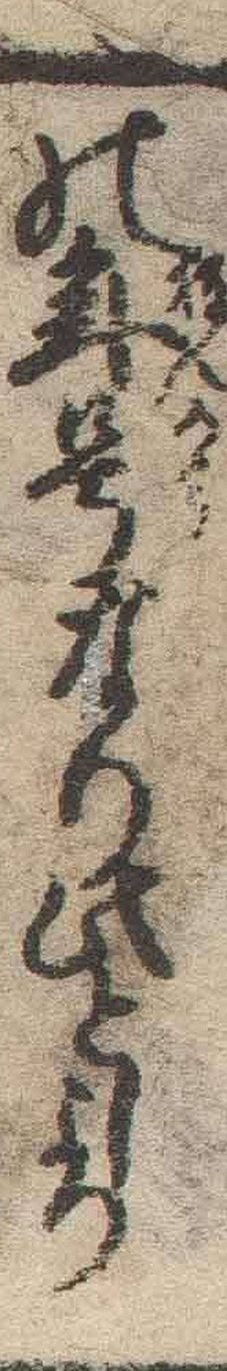の年号なり此としより
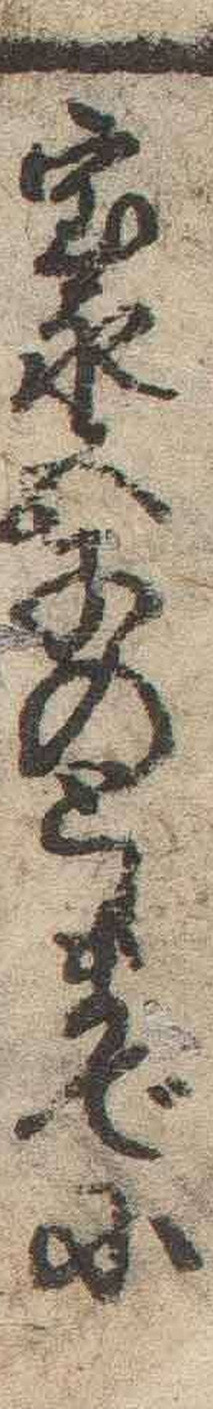宝永五子のとしまでに
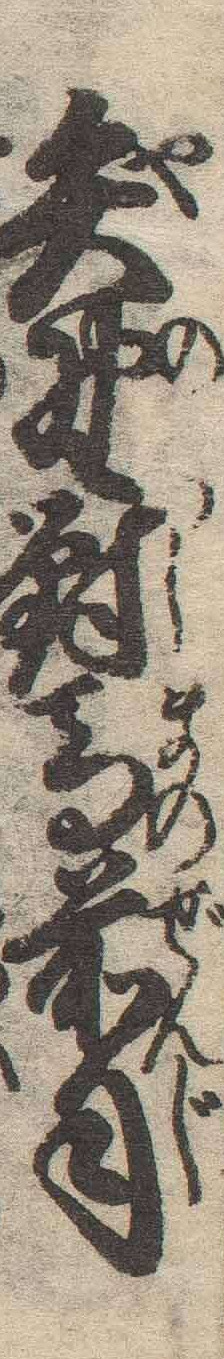矢野對馬前司
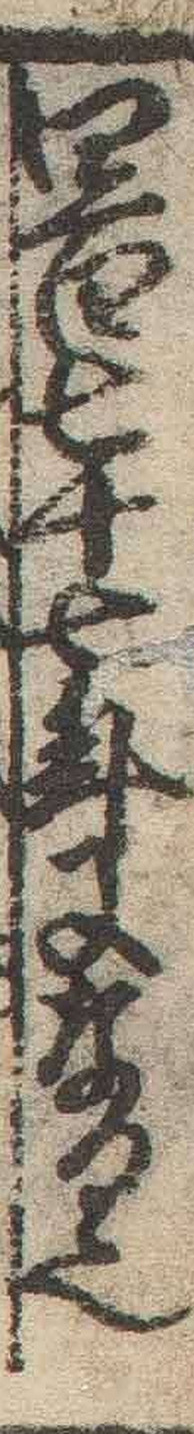四百七十七年になりる也
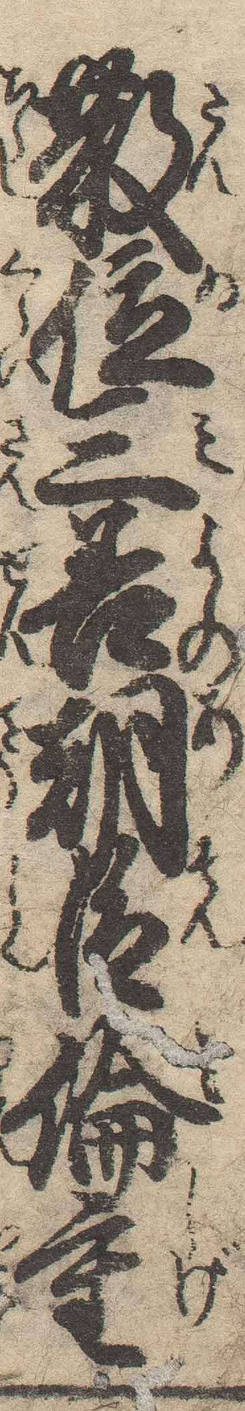散位三善朝臣倫重
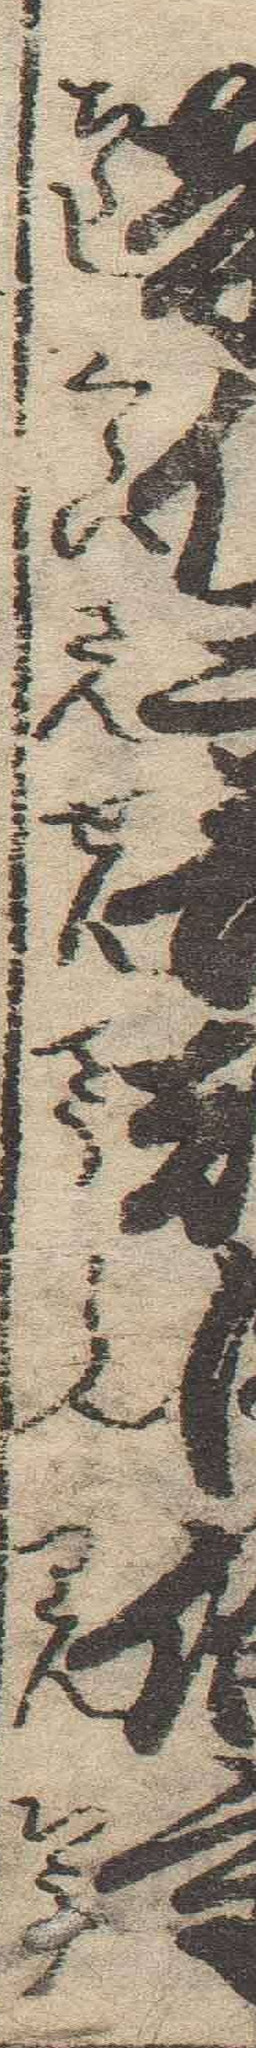ちらしくらいさんせんさうしんりんひとへ
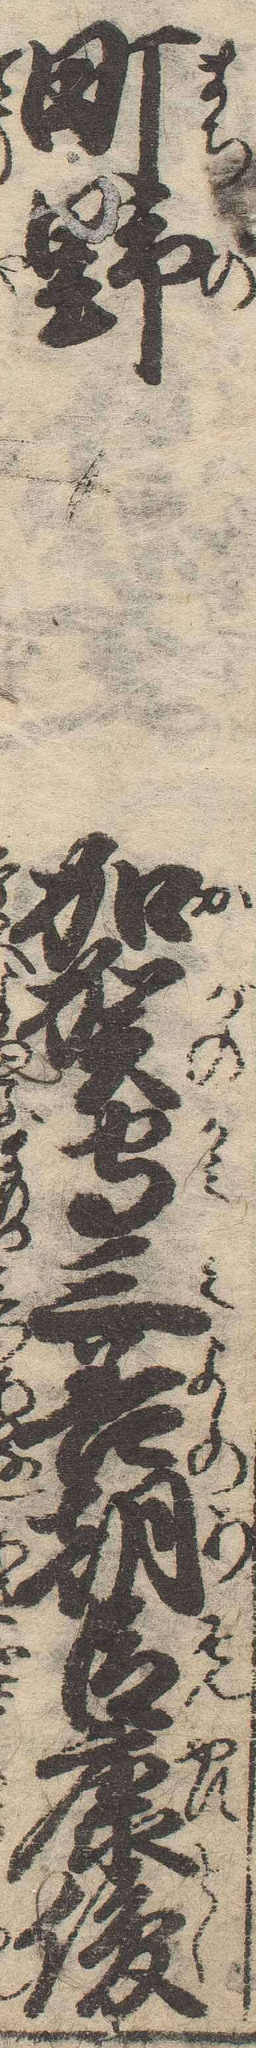町野加賀守三善朝臣康俊
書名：御成敗式目絵抄
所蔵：東京学芸大学附属図書館 国文学研究資料館
